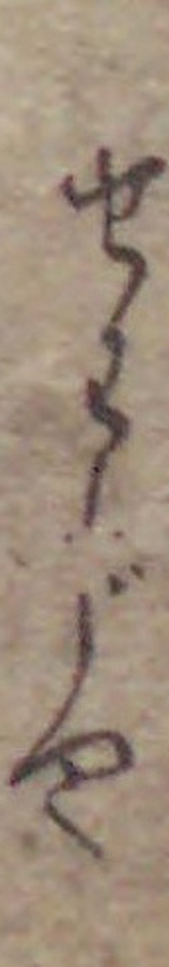せわじや
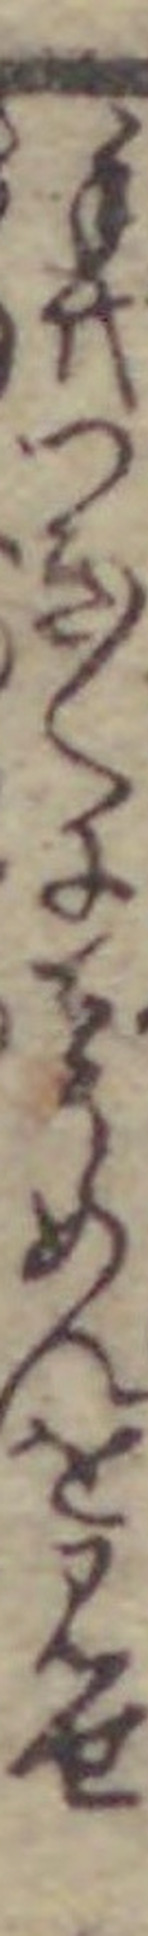手代つき〳〵にちうめんを見せ
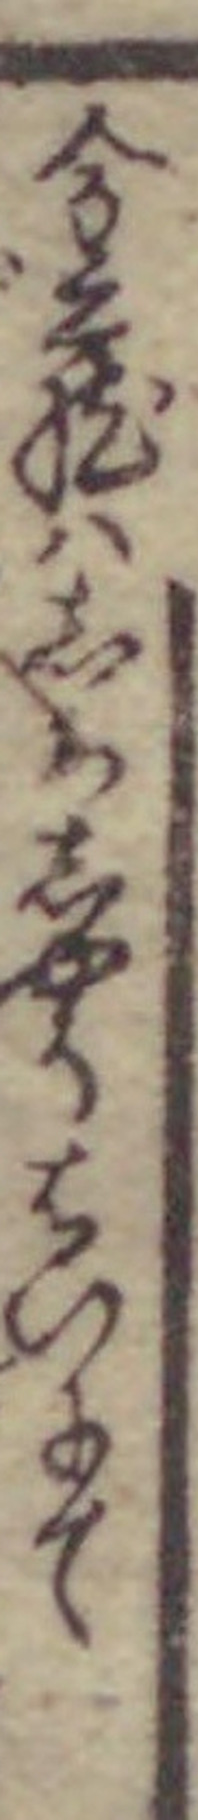金蔵はしちしやうはいにて
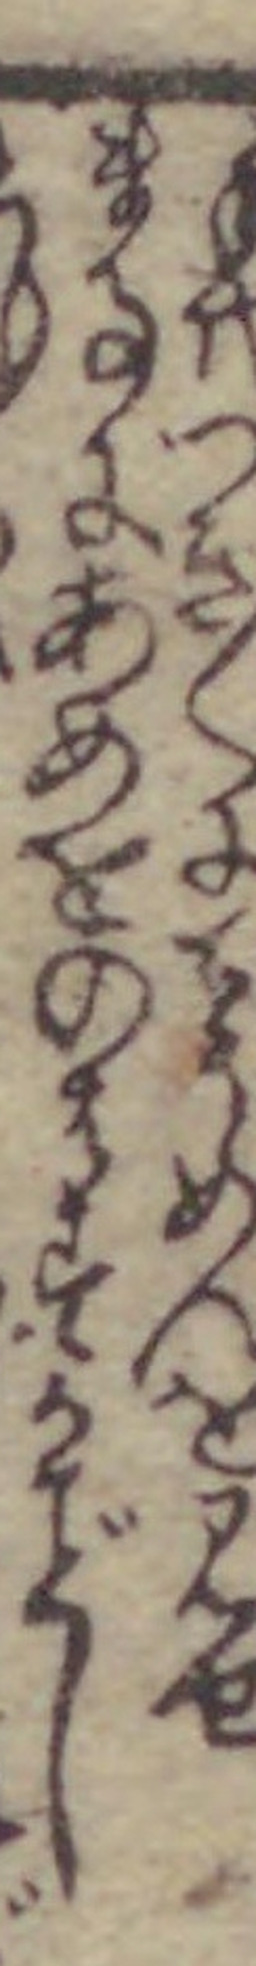ま事にあめをのはすかごとし
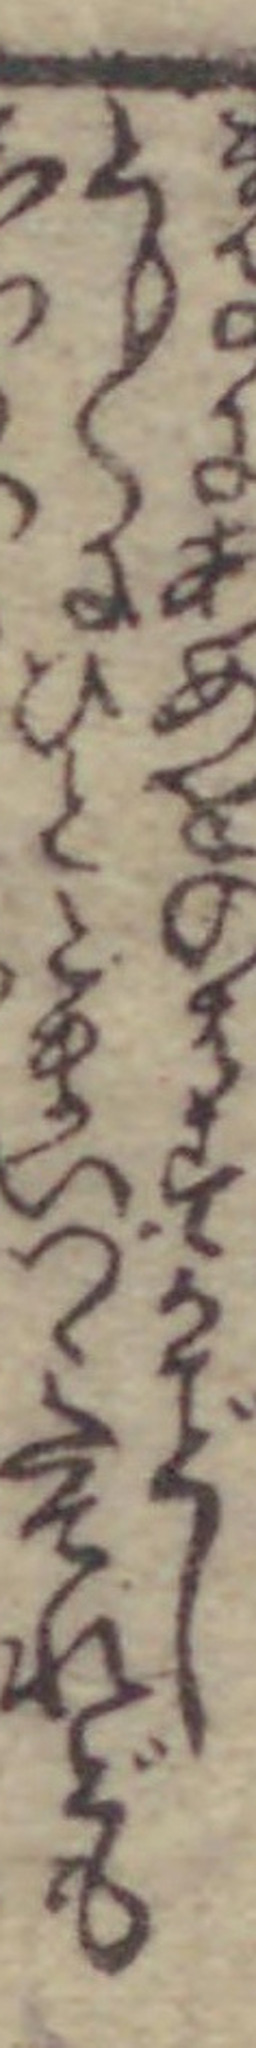とし〳〵にひとこまいつゝたてれども
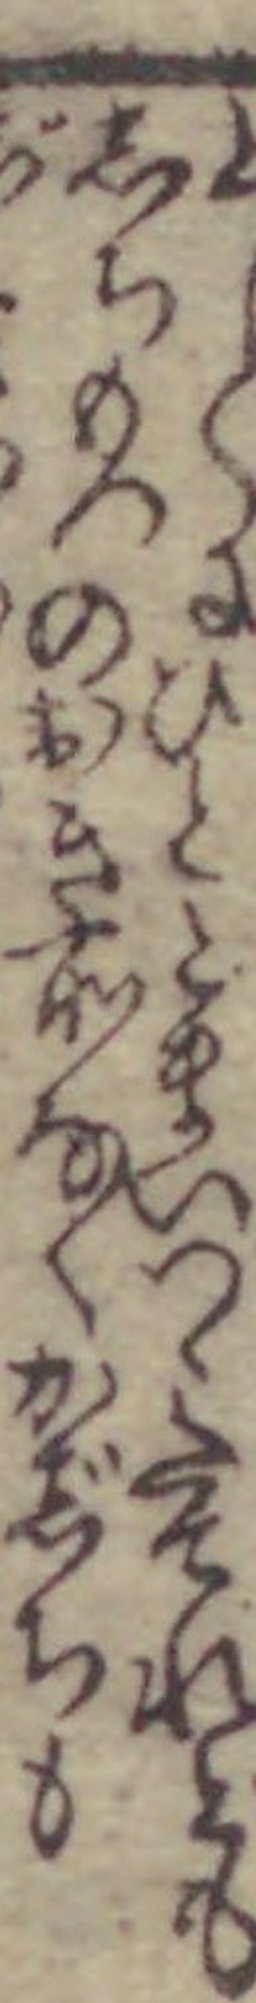しちもつのおき所なくかじちも
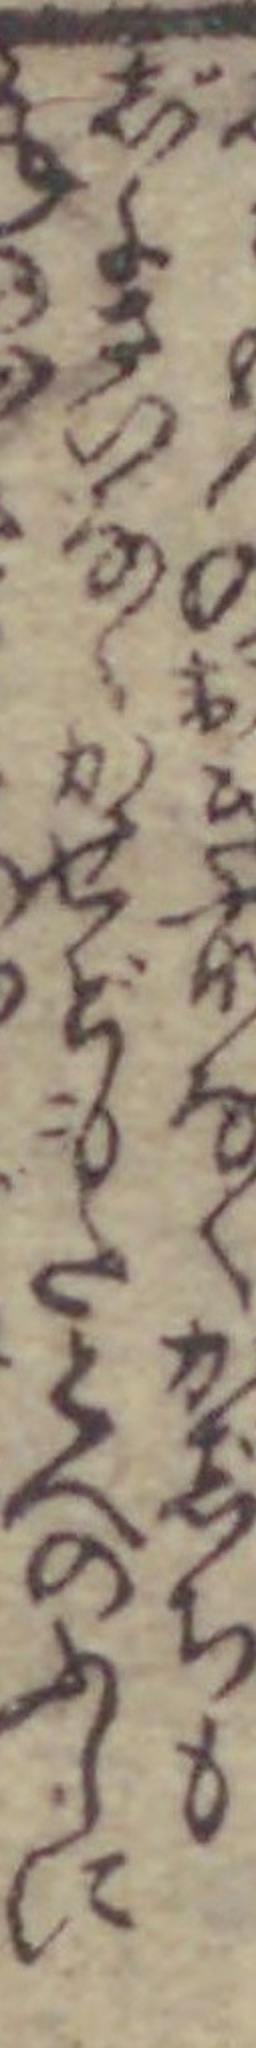じよさいなくかせどもたとへのふしに
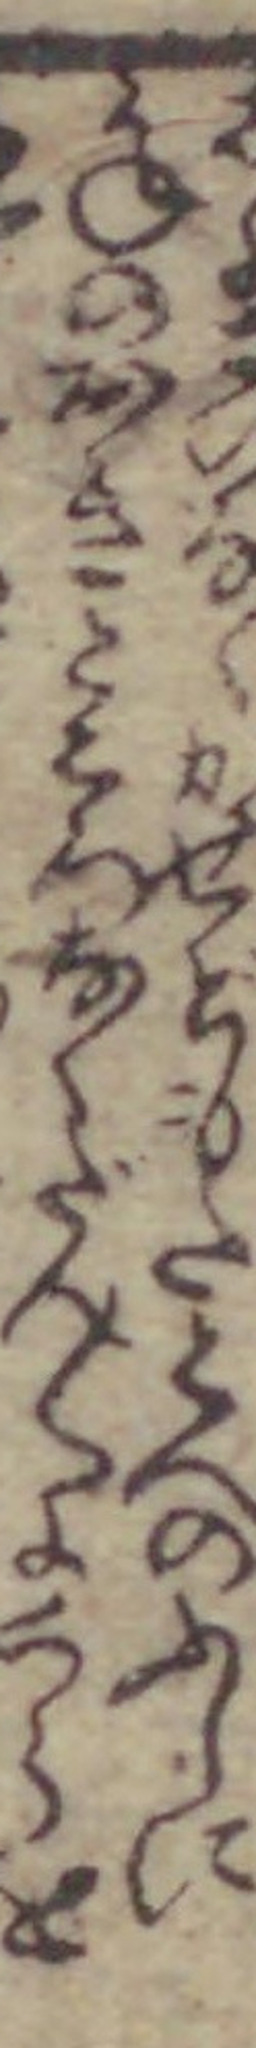かねのおきところなくだん〳〵にくらを
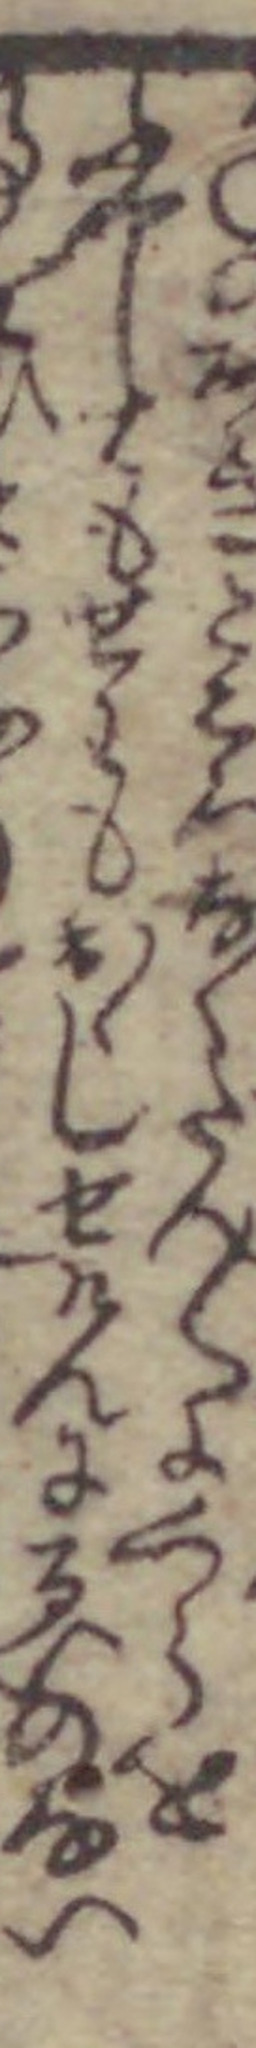ふやしてもせわもおゝしせけんにるいのない
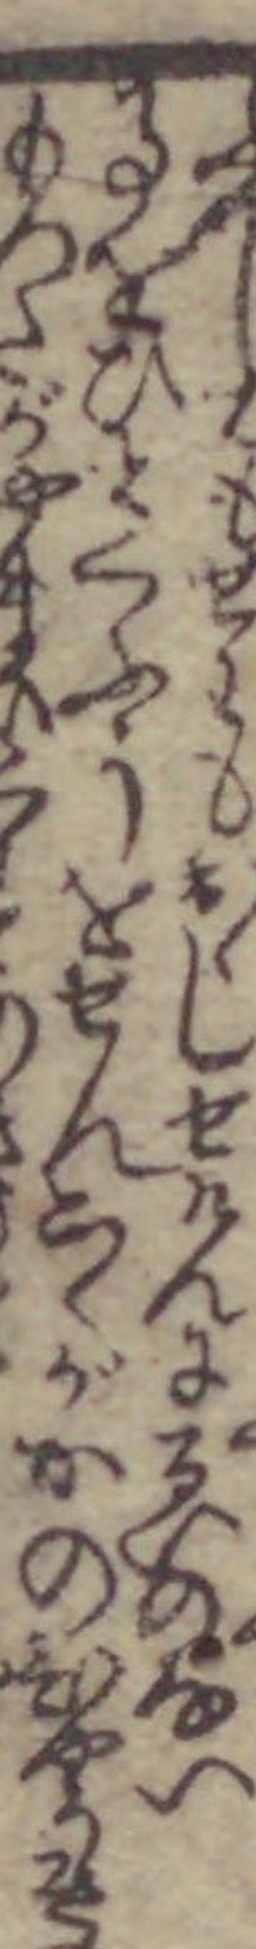事をひとくふうをせんこゝがかのひやうきの
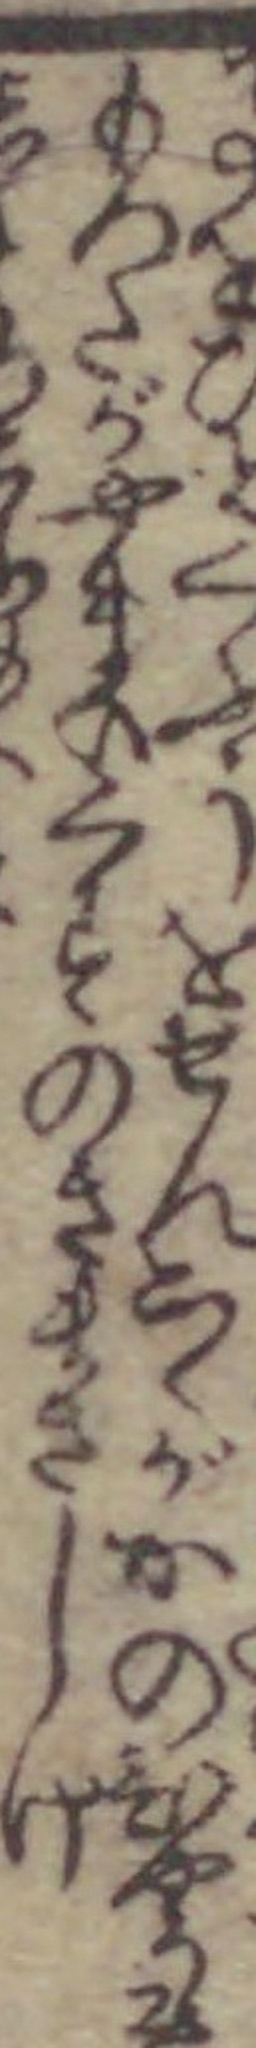もつたがやまいくすのきまさしげ

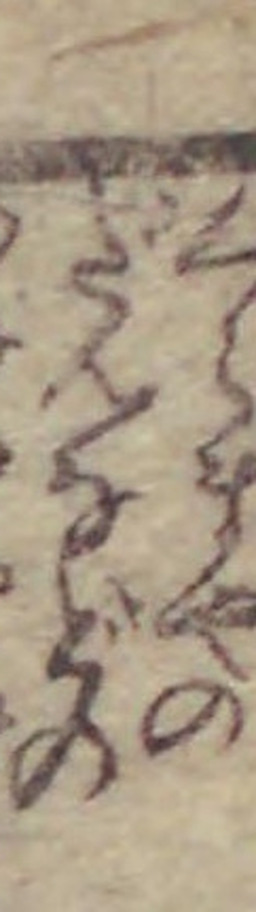だんなどの
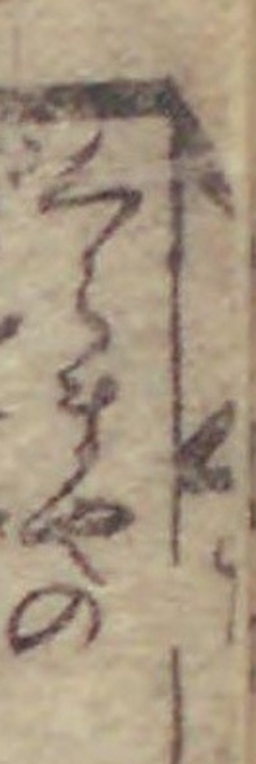くらまやの
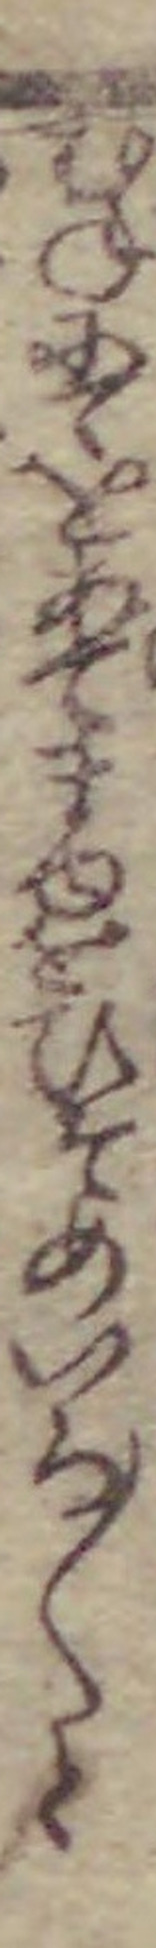むねにてをあてまゆをひそめいろ〳〵と
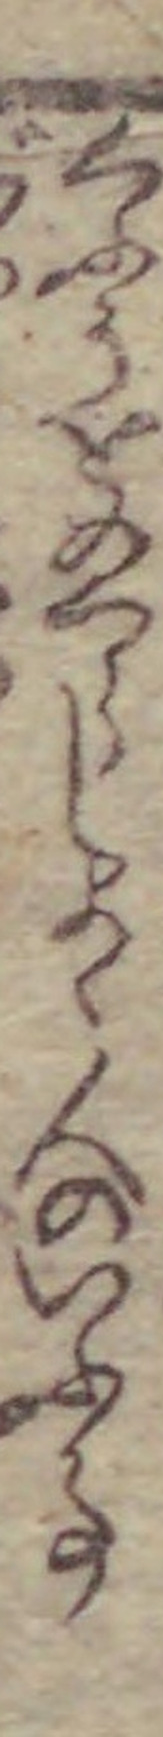くふうをめくらしよく人のいふ事
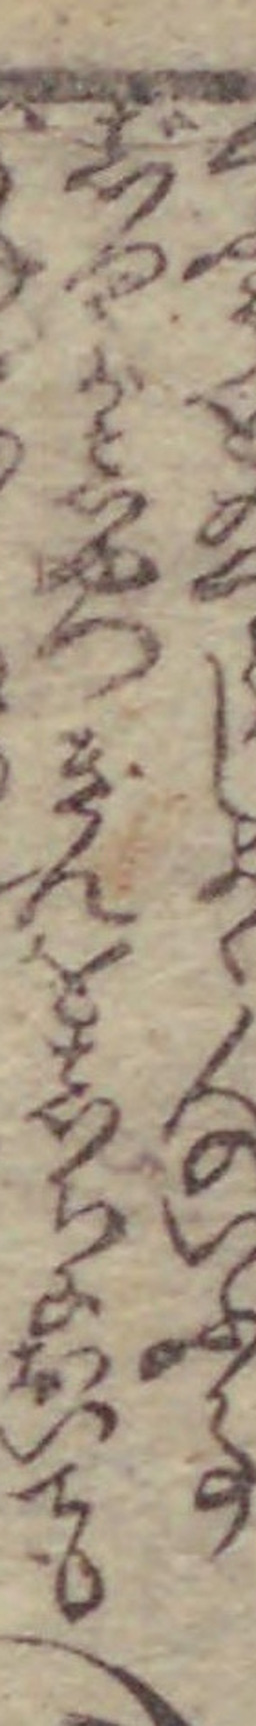じやがしやつきんしちにおいても
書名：御代の御寶
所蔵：国立国会図書館 National Diet Library, JAPAN
